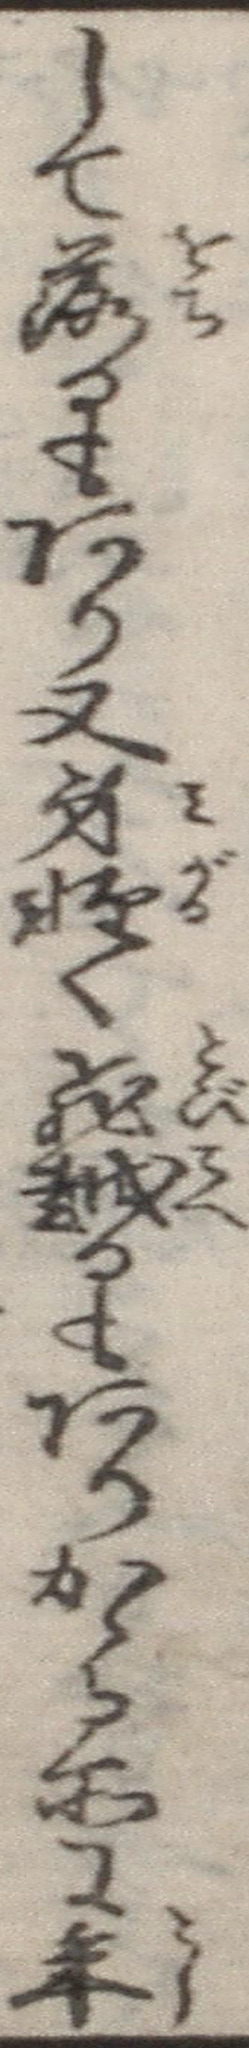して落るもあり又身軽く飛越るもありかゝる所に年
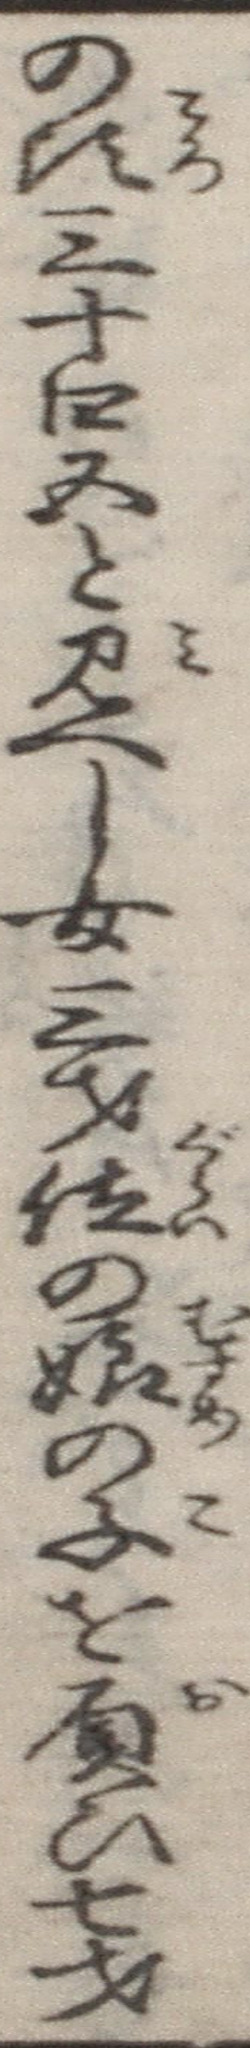の頃三十四五と見へし女三才位の娘の子を負ひ七才
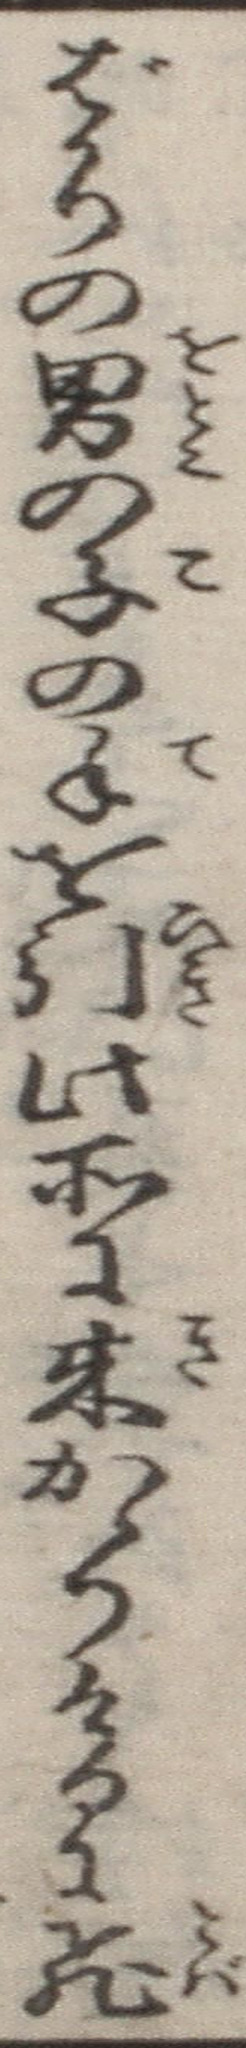ばかりの男の子の手を引此所に来かゝりけるに飛
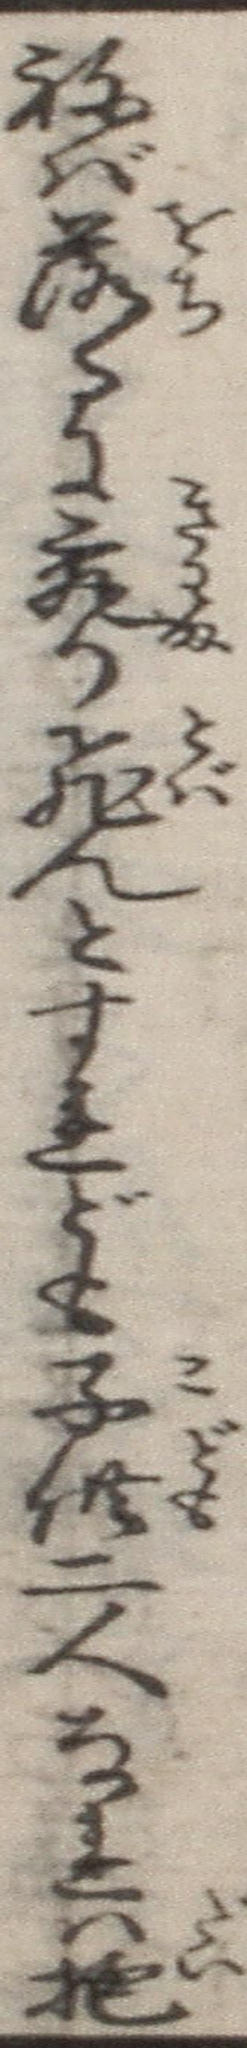ねば落るに究り飛んとすれども子供二人なれは抱
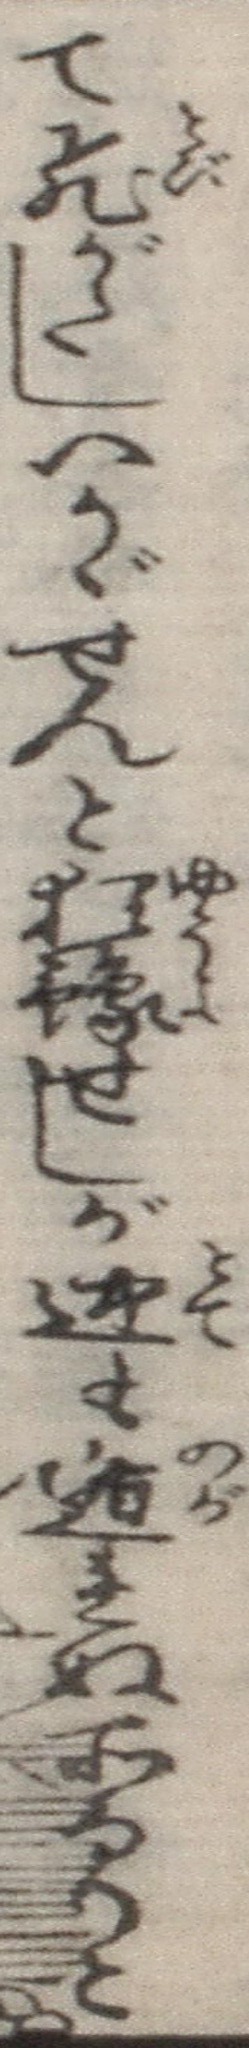て飛がたしいかゞせんと猶豫せしが迚も遁れぬ所なりと
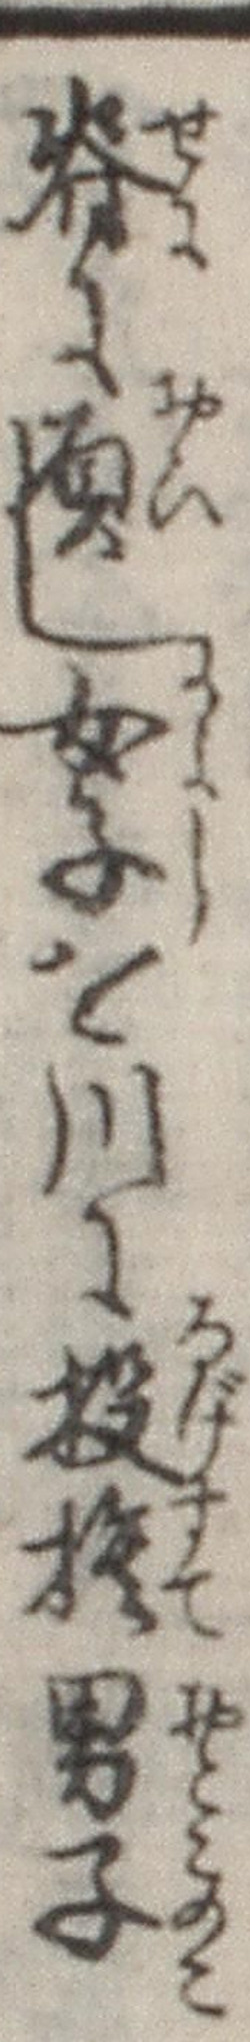背に負し女子を川に投捨男子
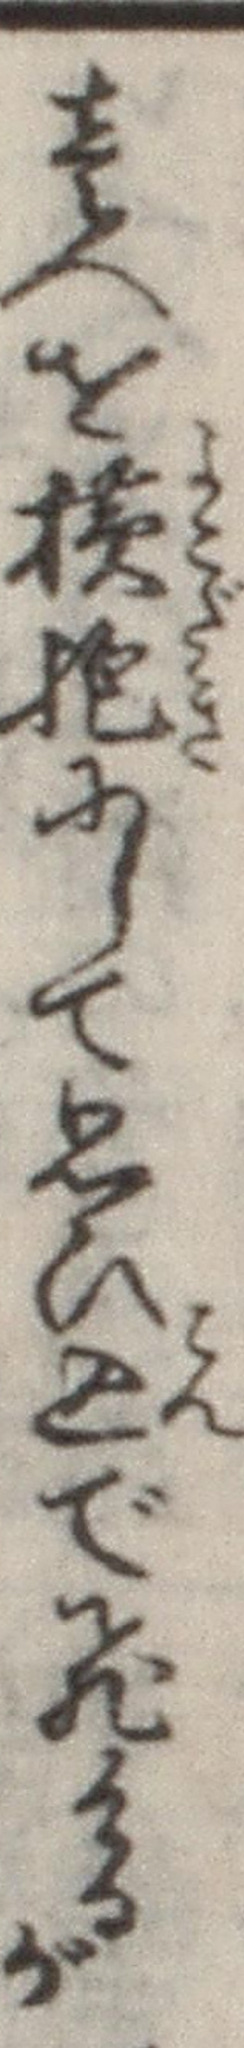壱人を横抱にして思ひ込んで飛けるが
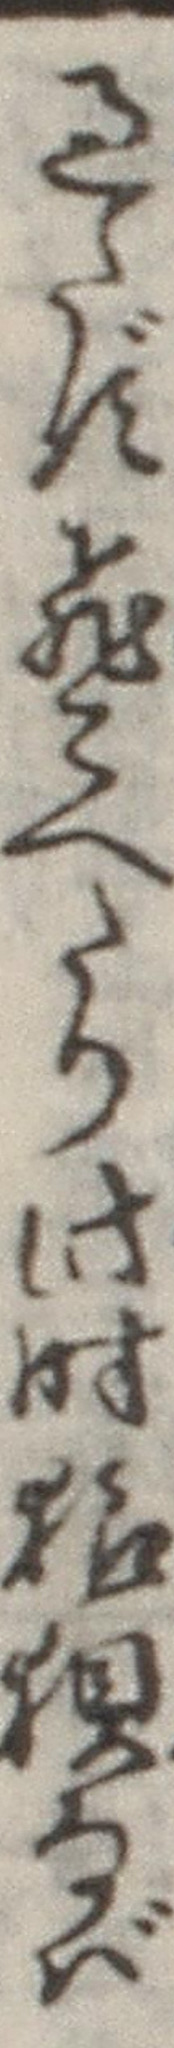過たず飛こへたり此時狼狽なば
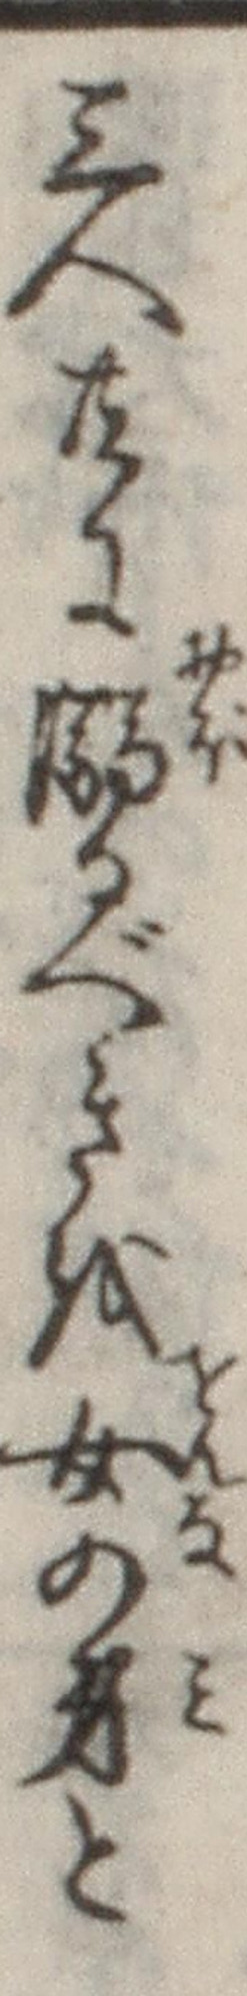三人共に溺るべきを女の身と
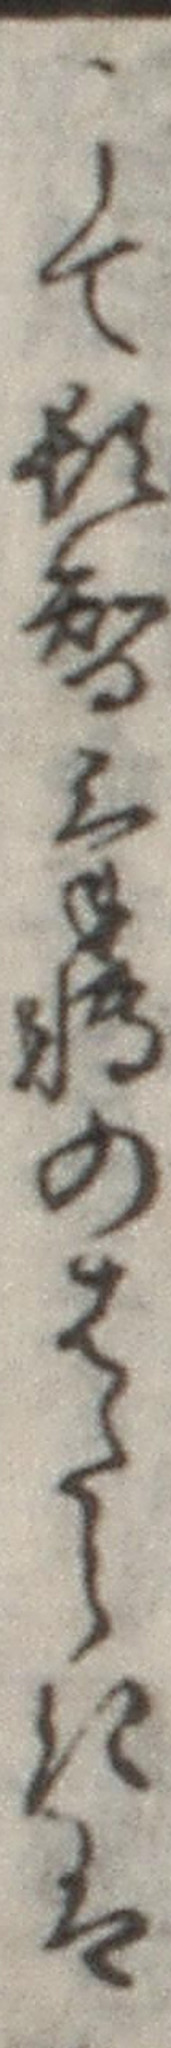して頓智気轉のはたらきは
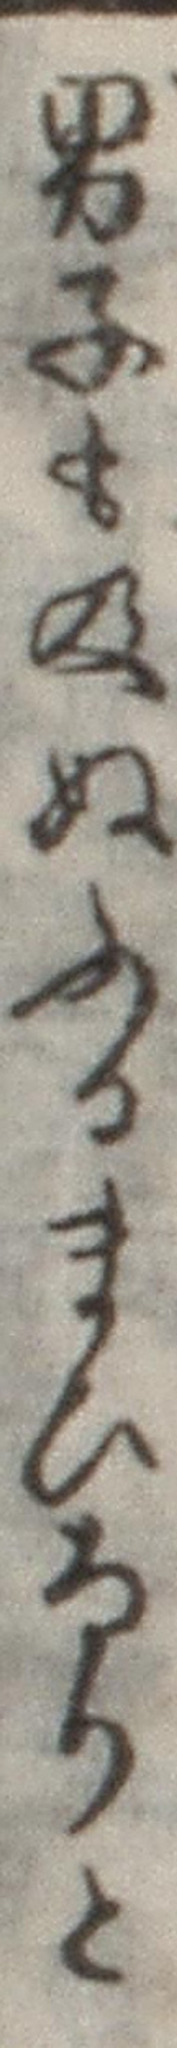男子も及ぬふるまひなりと
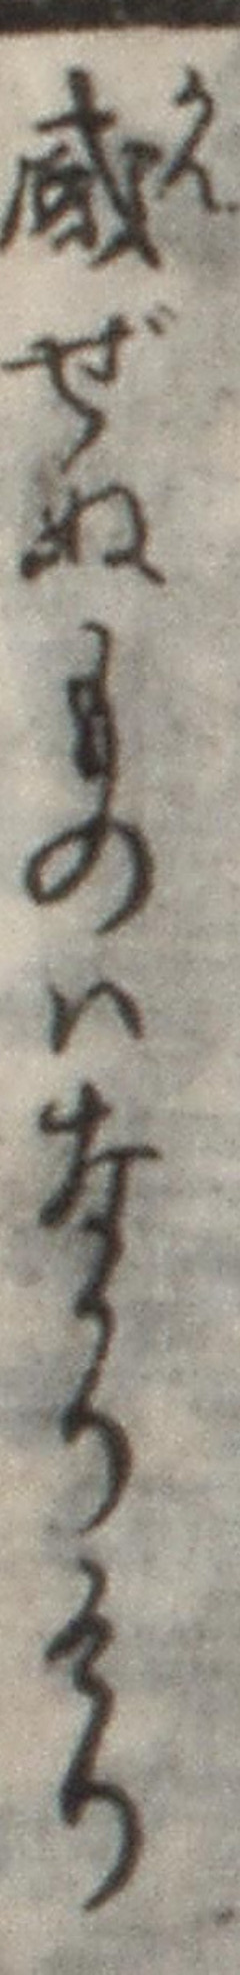感ぜぬものハなかりけり

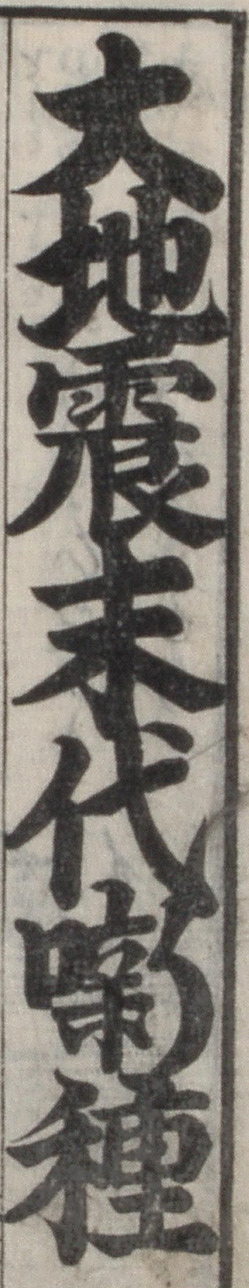大地震末代噺種
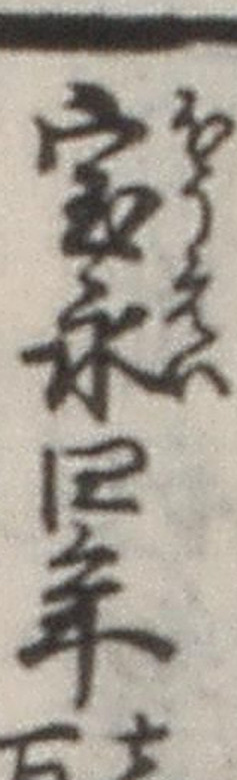宝永四年
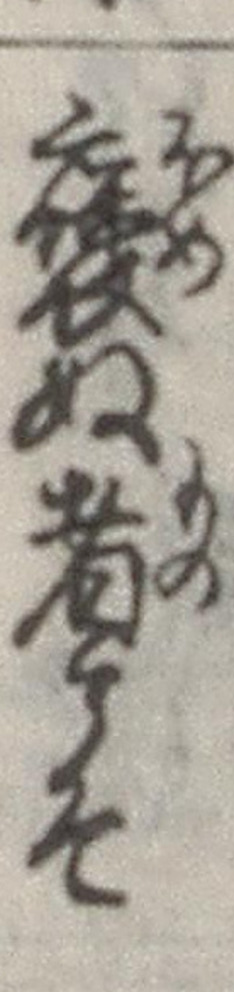褒ぬ者こそ
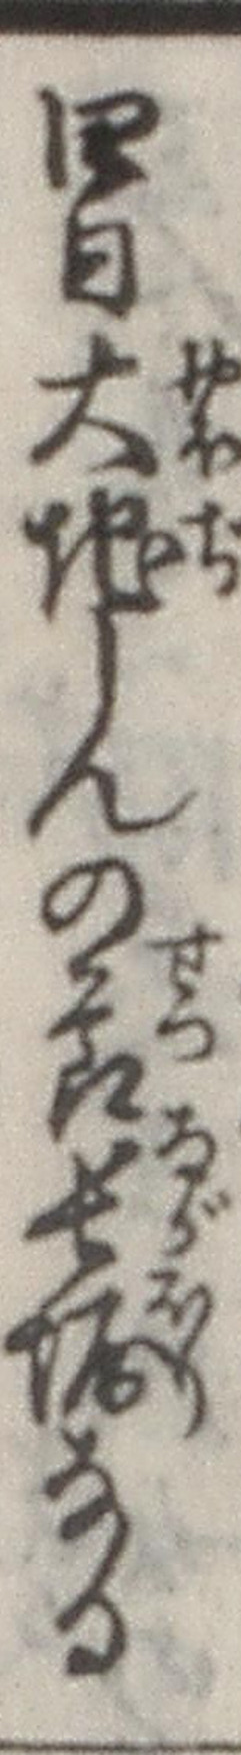四日大地しんの節長堀なる
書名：諸國大地震年代記　末代噺種
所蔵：東京大学地震研究所図書室 Earthquake Research Institute Library, The University of Tokyo, JAPAN
